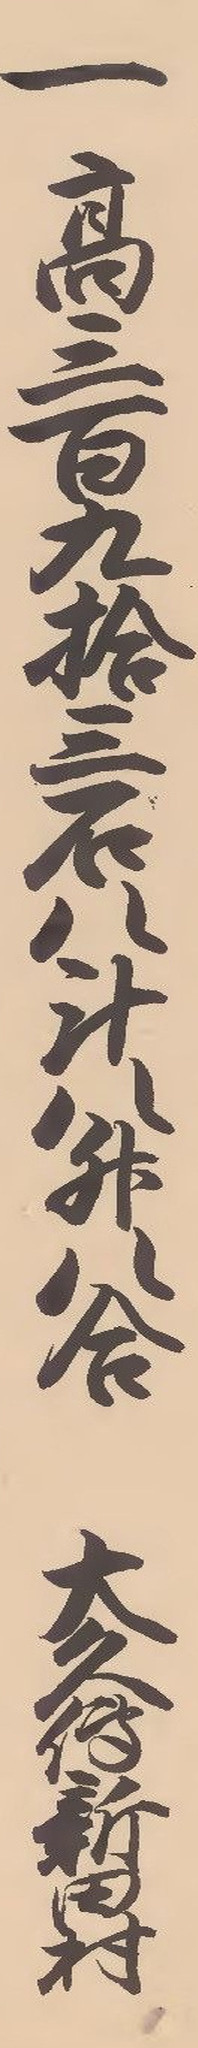一高三百九拾三石八斗八升八合大久伝新田村
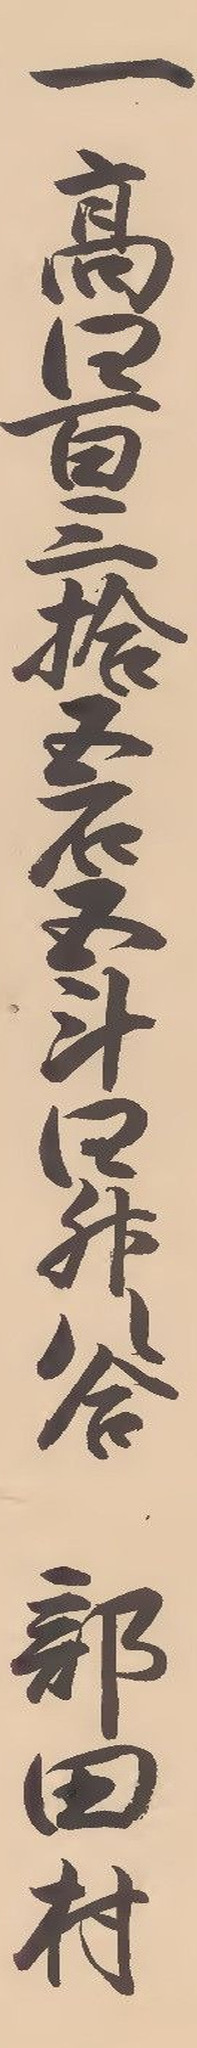一高四百三拾五石五斗四升八合部田村
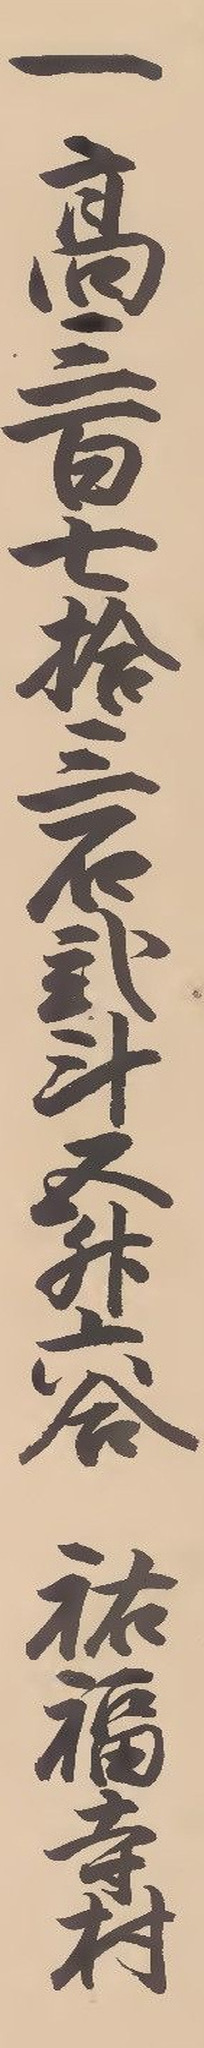一高三百七拾三石弐斗五升六合祐福寺村
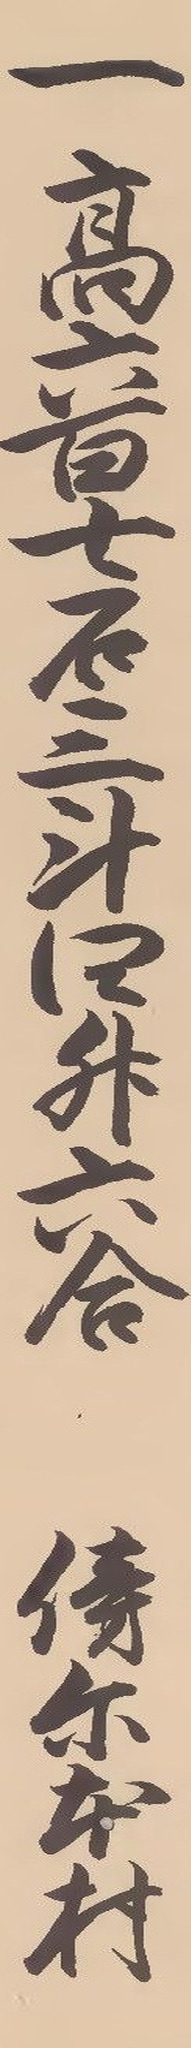一高六百七石三斗四升六合傍示本村
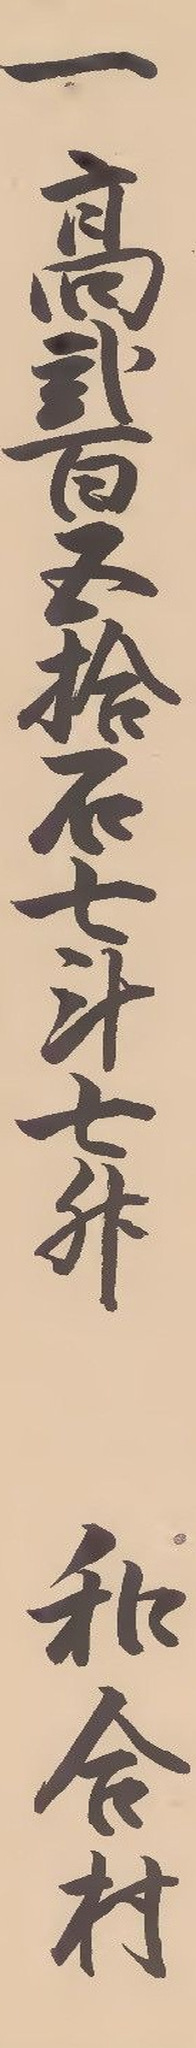一高弐百五拾石七斗七升和合村

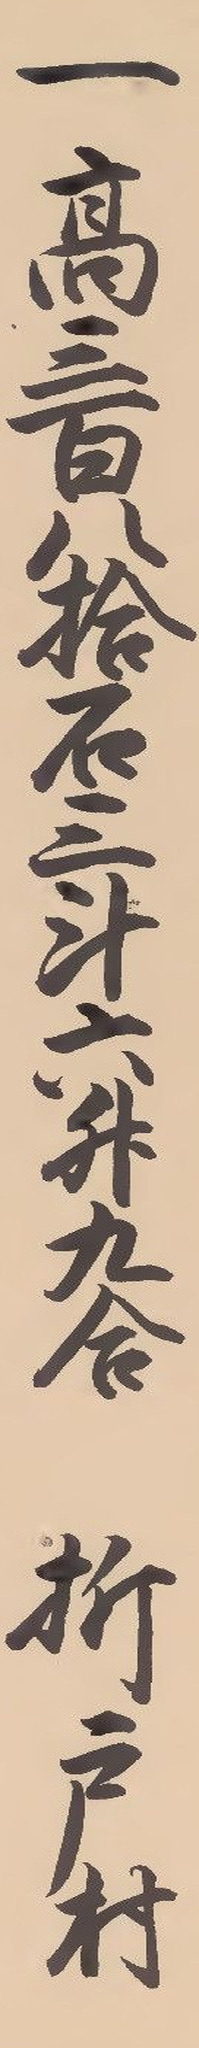一高三百八拾石三斗六升九合折戸村
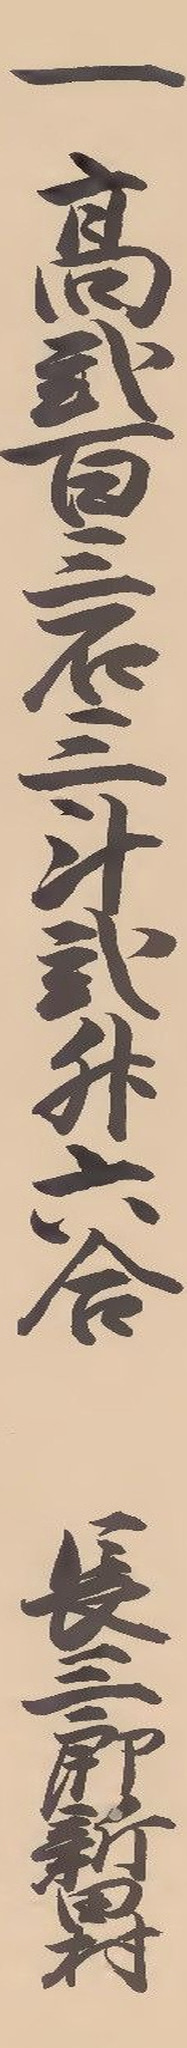一高弐百三石三斗弐升六合長三郎新田村
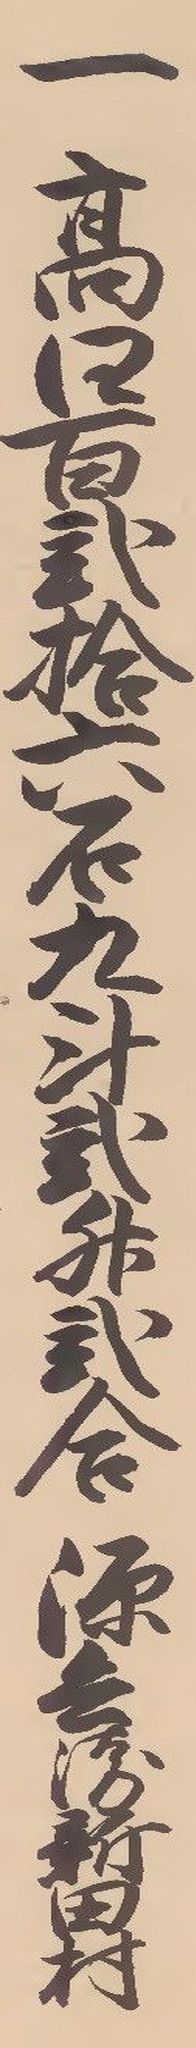一高四百弐拾六石九斗弐升弐合源兵衛新田村
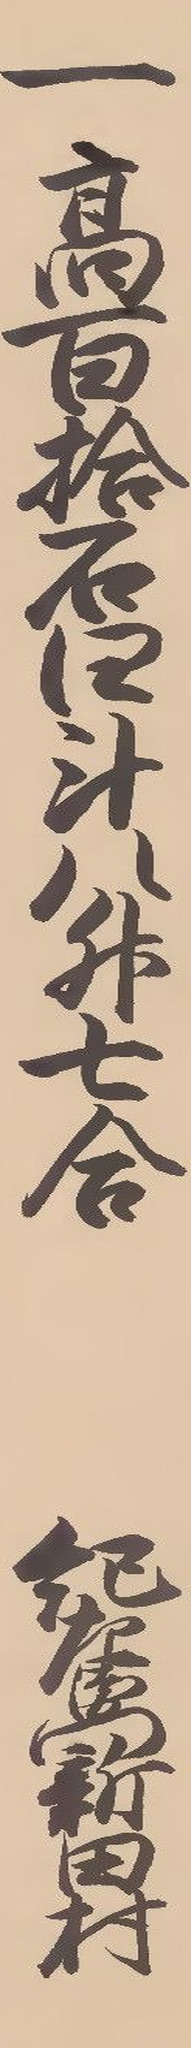一高百拾石四斗八升七合紀左衛門新田村
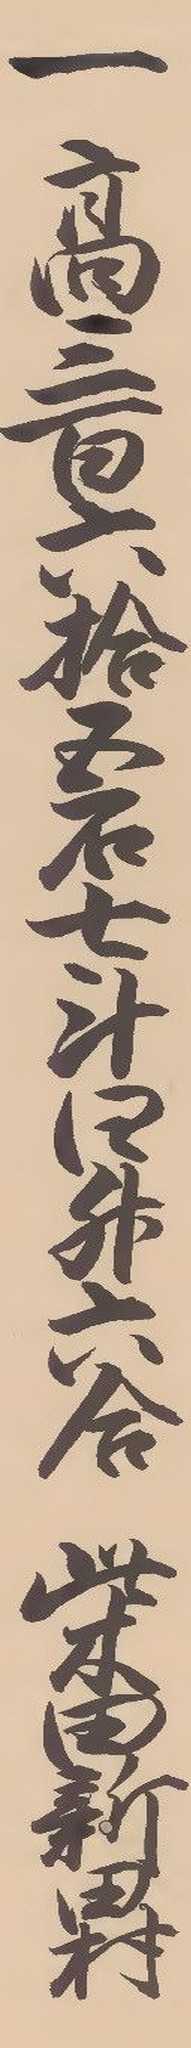一高三百六拾五石七斗四升六合柴田新田村
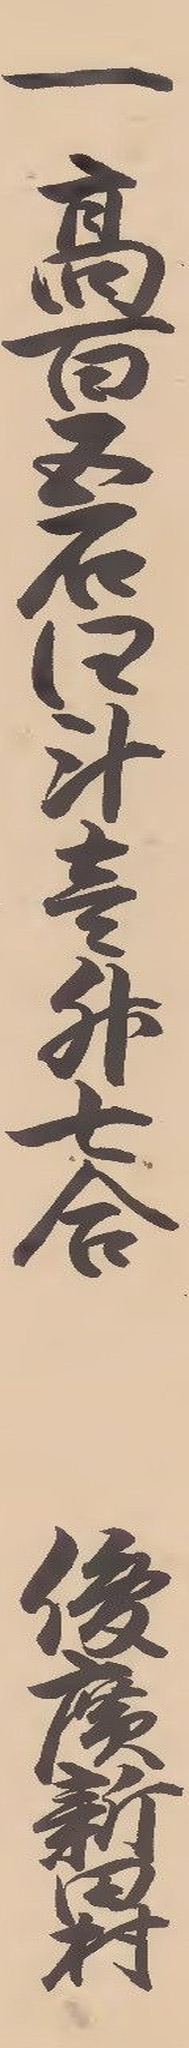一高百五石四斗壱升七合俊広新田村
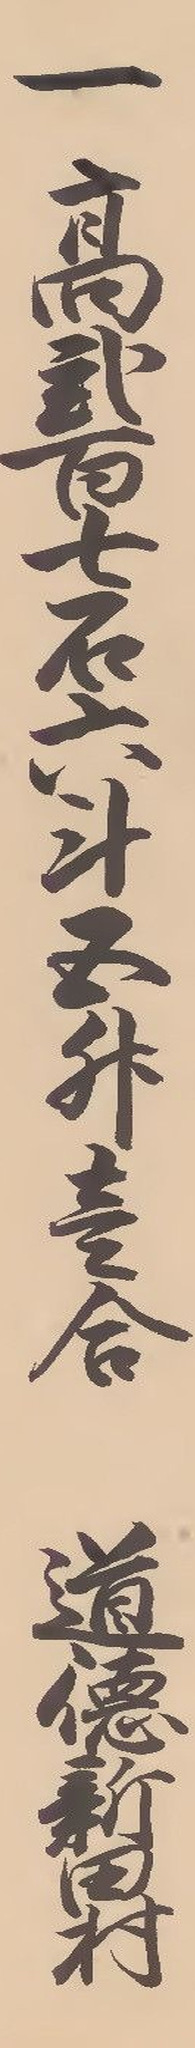一高弐百七石六斗五升壱合道徳新田村

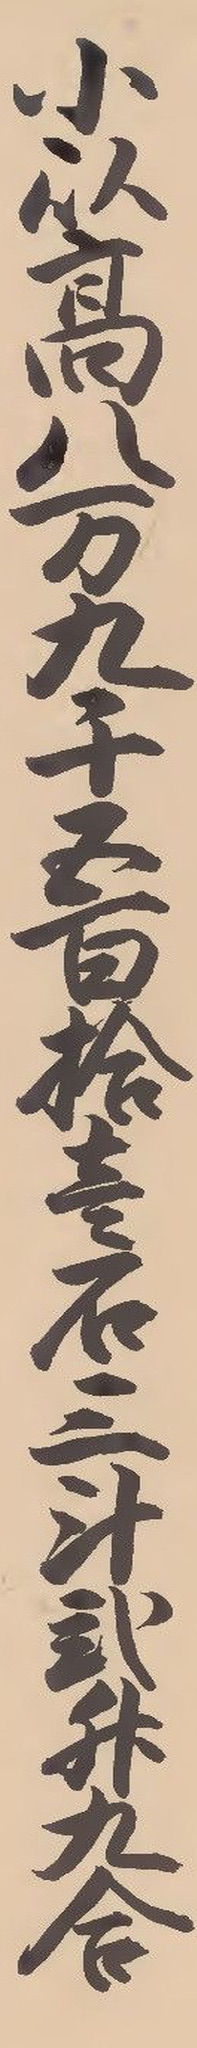小以高八万九千五百拾壱石三斗弐升九合
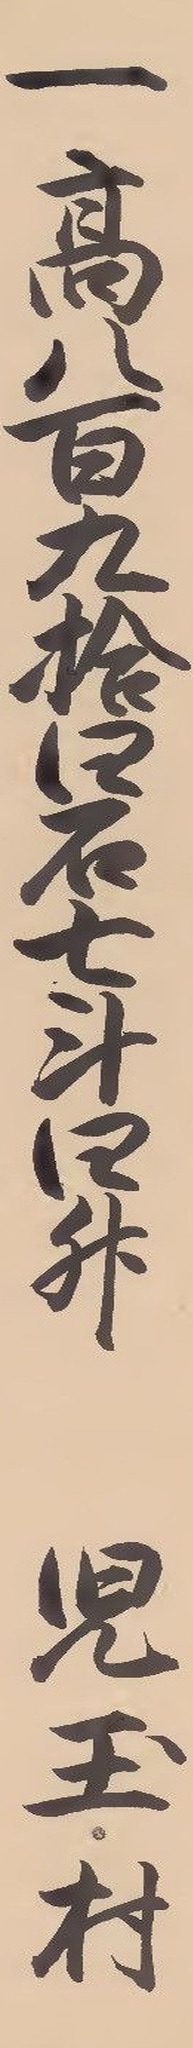一高八百九拾四石七斗四升児玉村
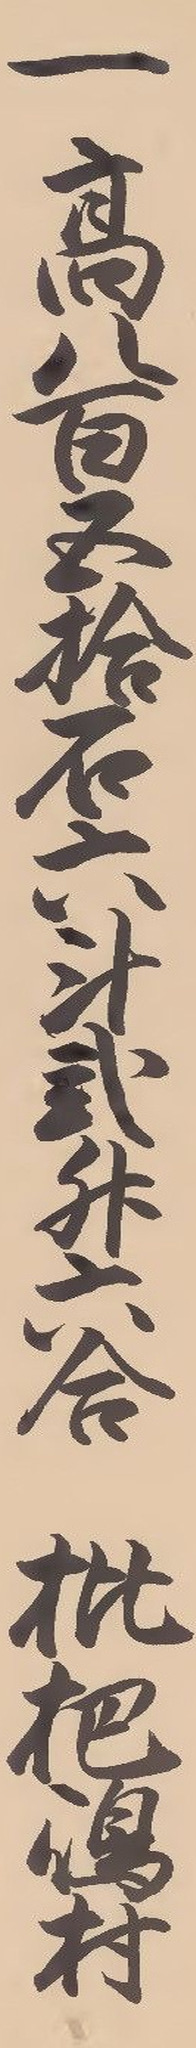一高八百五拾石六斗弐升六合枇杷島村
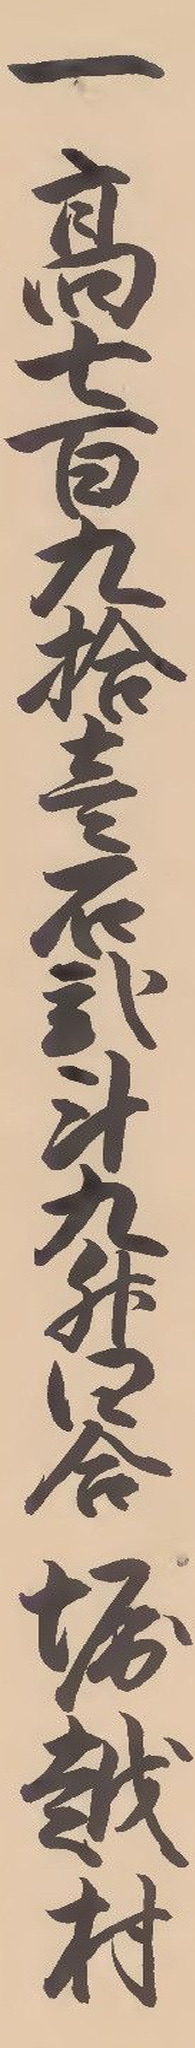一高七百九拾壱石弐斗九升四合堀越村
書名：尾張国郷帳
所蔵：国立公文書館 National Archives of Japan
